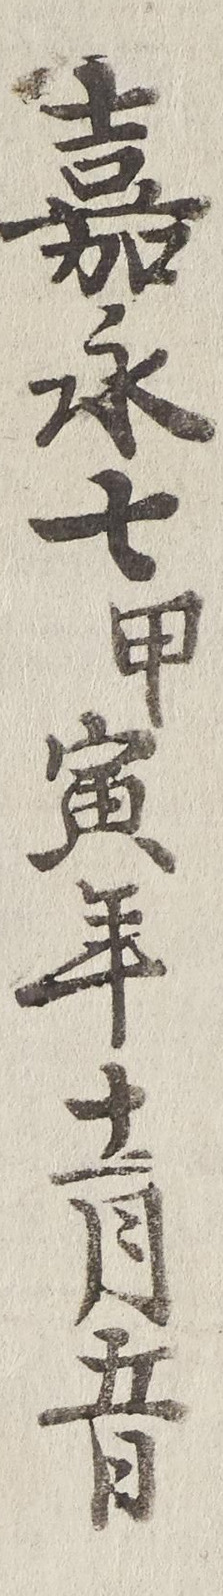嘉永七甲寅年十一月五日
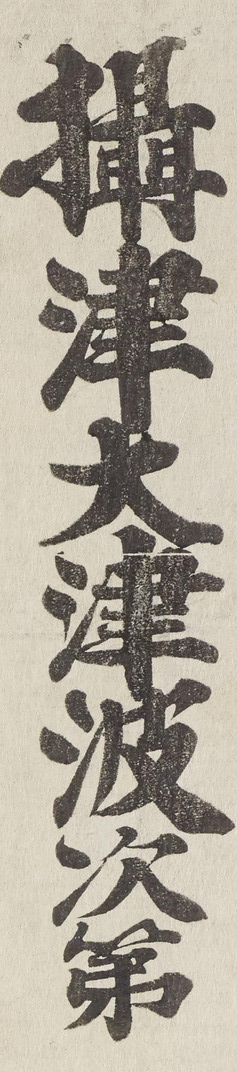摂津大津波次第
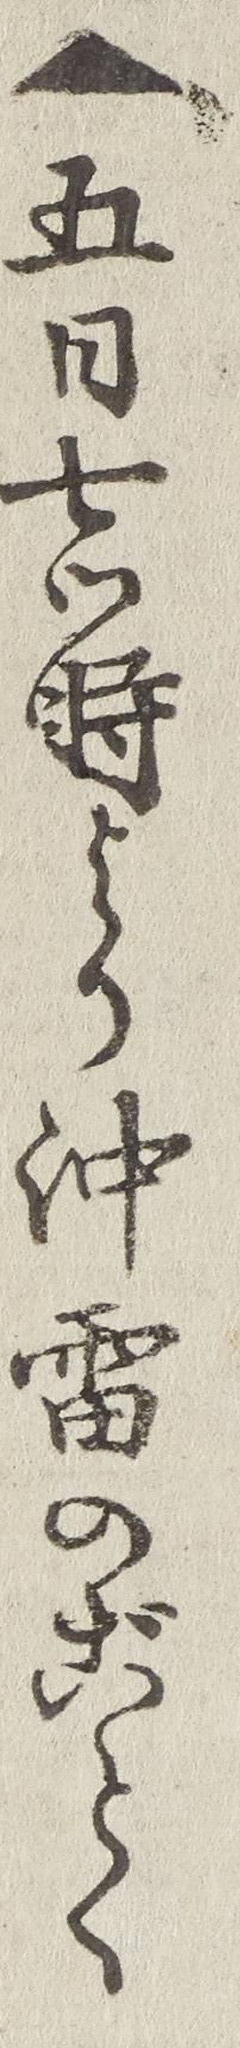▲五日七ツ時より沖雷のごとく
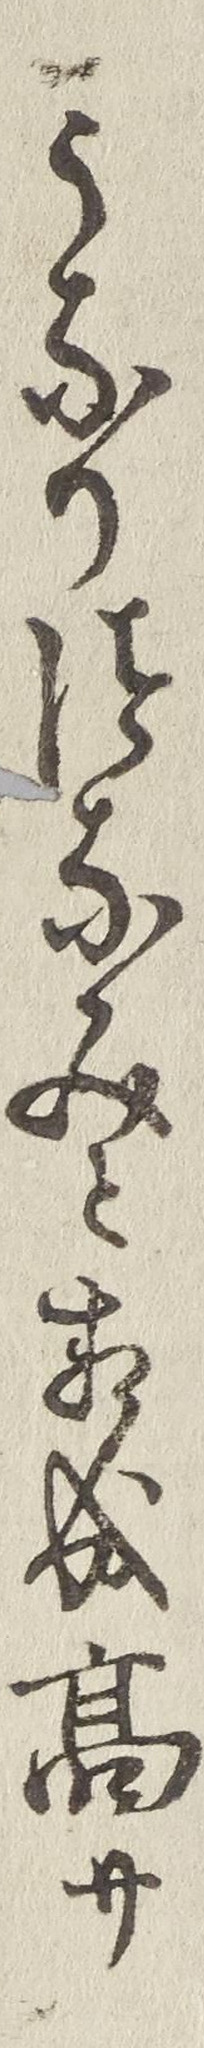うなりつなみと相成高サ
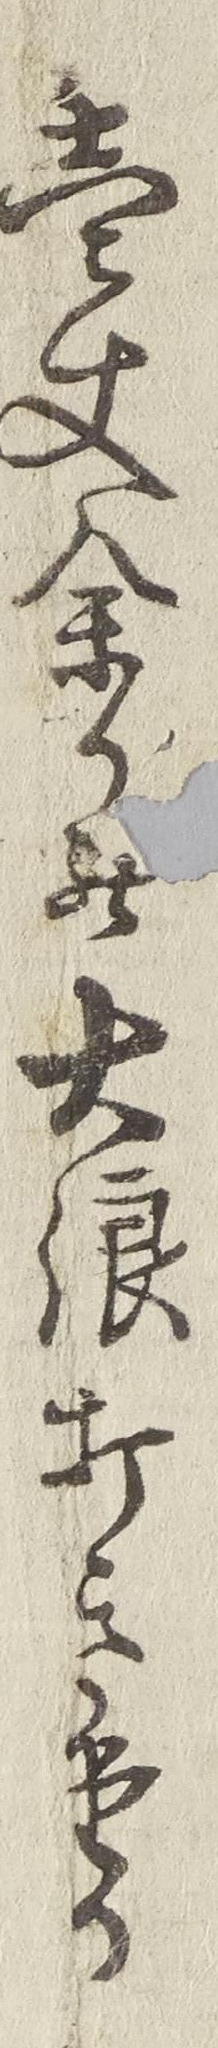壱丈余りの大浪打きたり
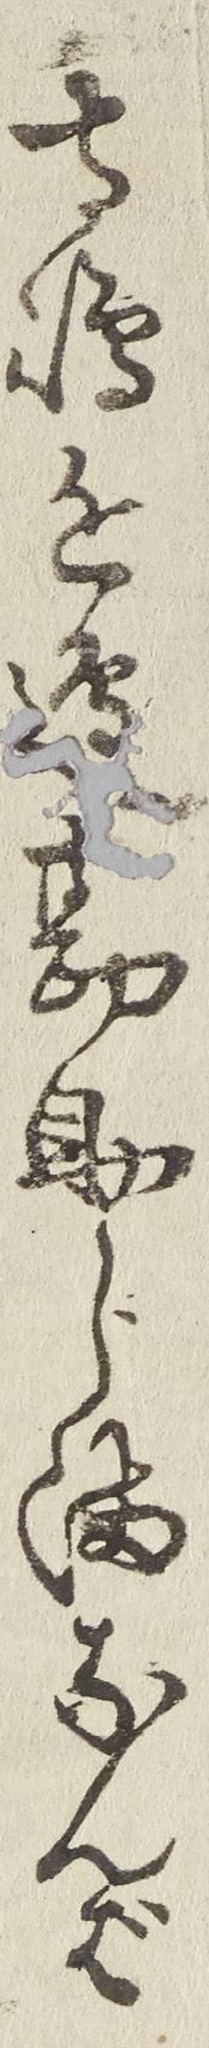寺嶋近辺勘助しまなんば
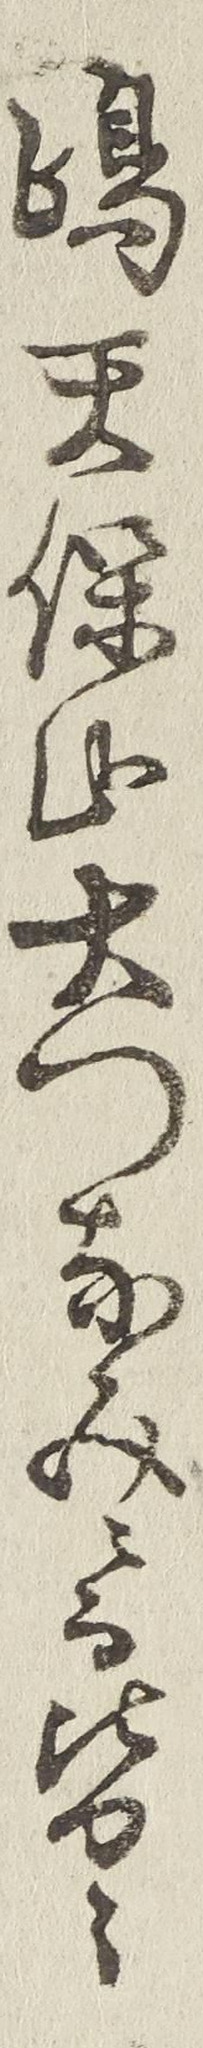嶋天保山大つなみにて皆々
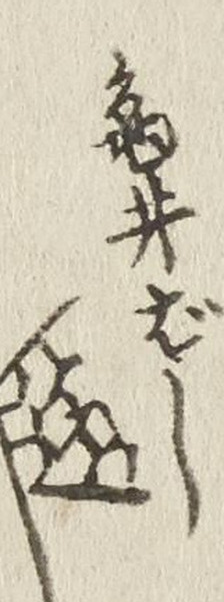亀井はし
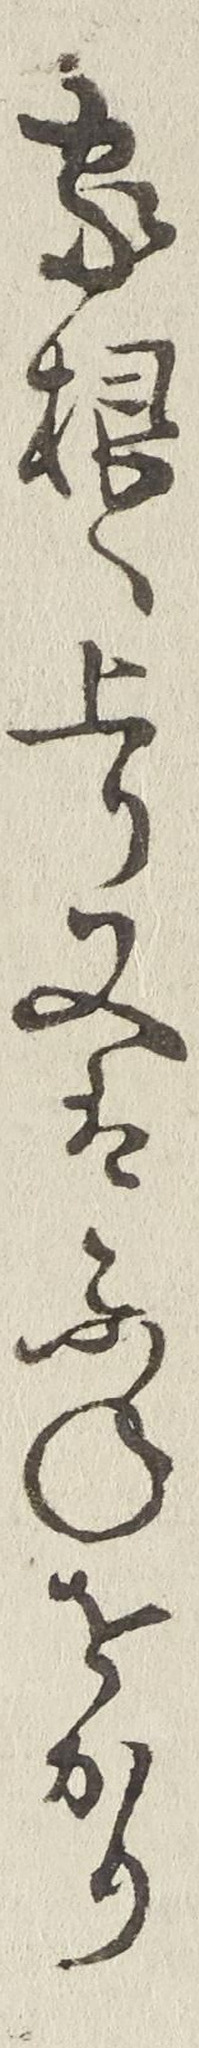家根へ上り又はふねをかり
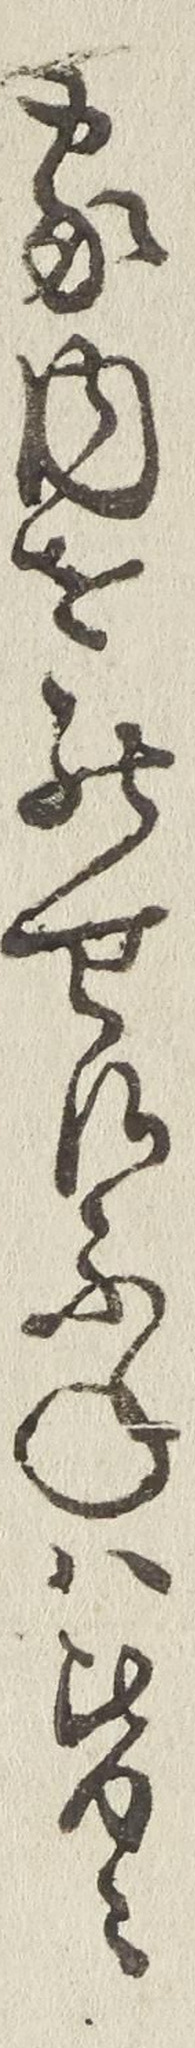家内をのせ候ふねは皆々
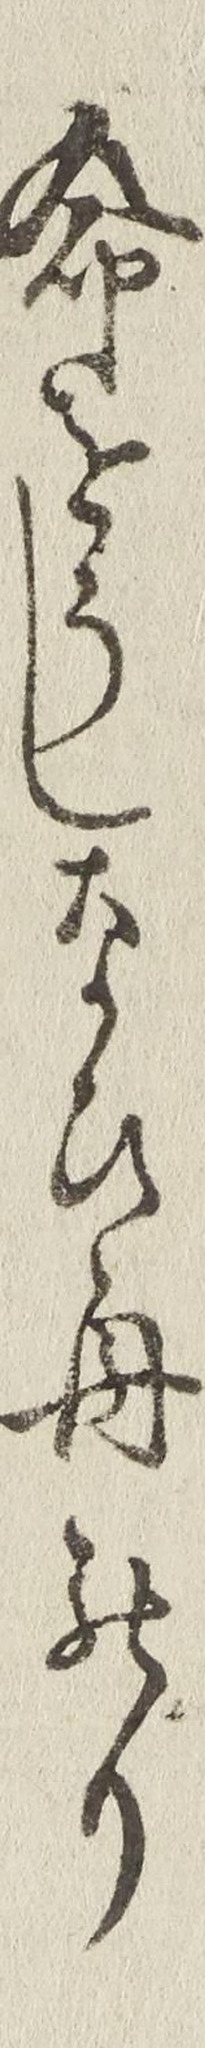命をしなひ舟のり
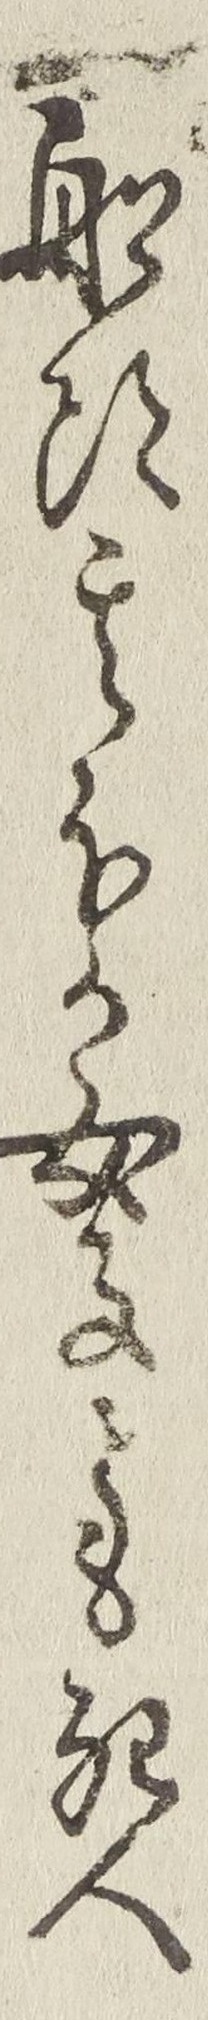船頭其ほか女子にも死人
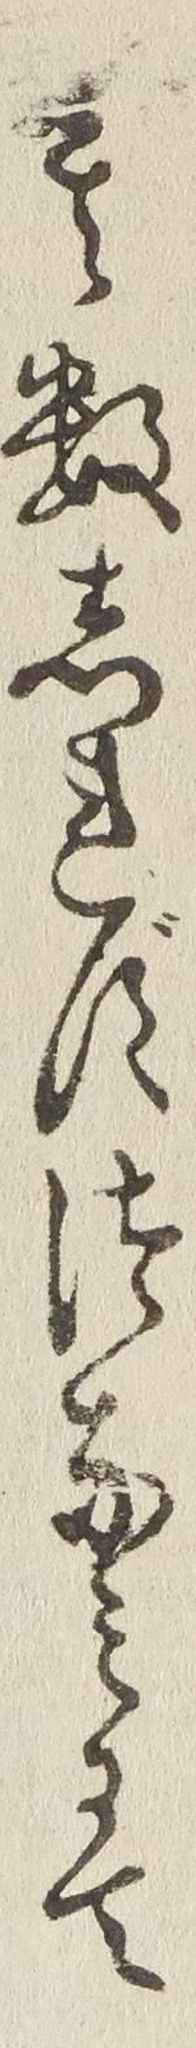其数しれずつなみにて
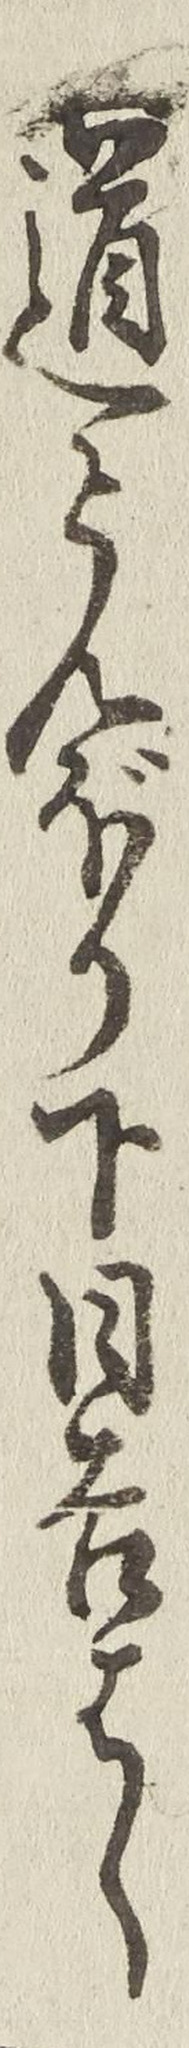道とんぼり下日吉はし
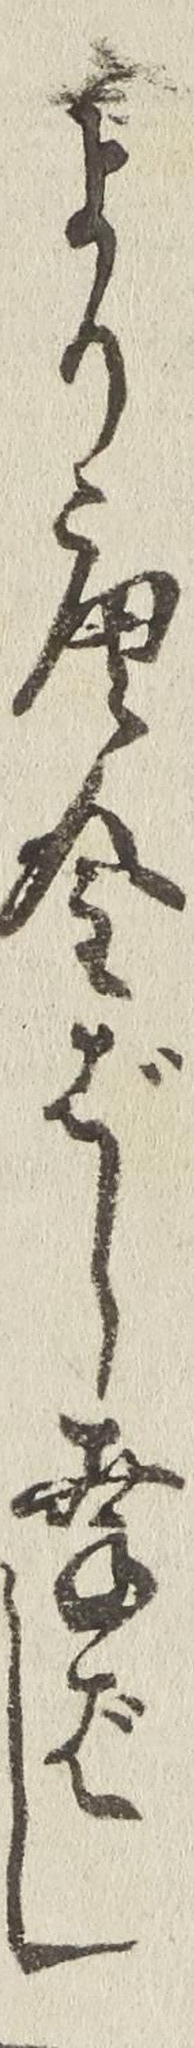より唐金ばし幸ばし
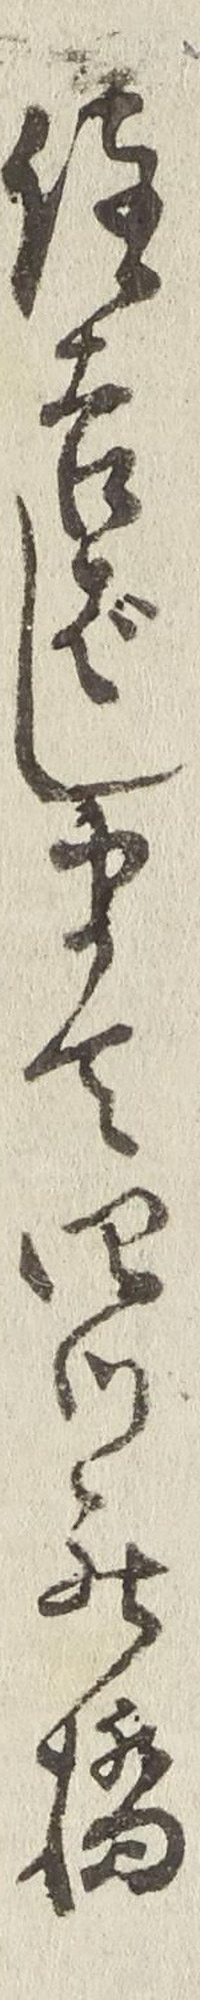住吉ばしまで四つの橋
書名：嘉永七甲寅年十一月五日　攝津大津波次第
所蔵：東京大学地震研究所図書室 Earthquake Research Institute Library, The University of Tokyo, JAPAN
